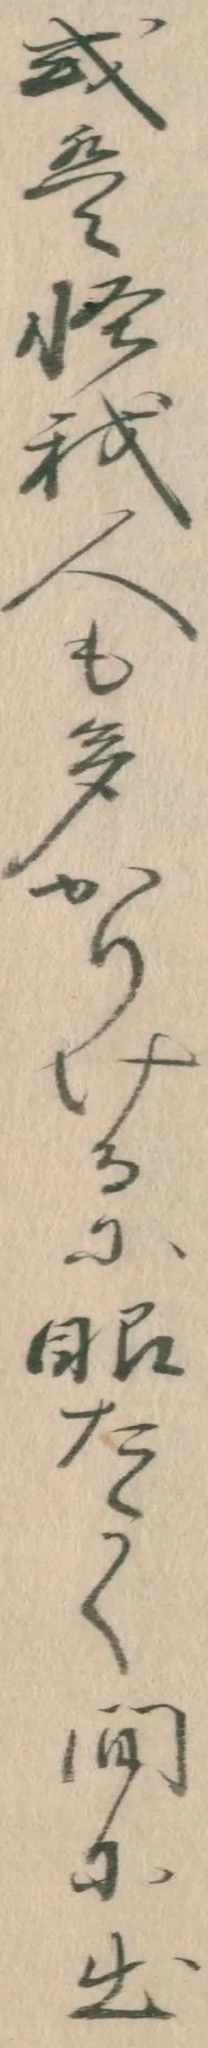或は怪我人も多かりけるに眼たゝく間に出
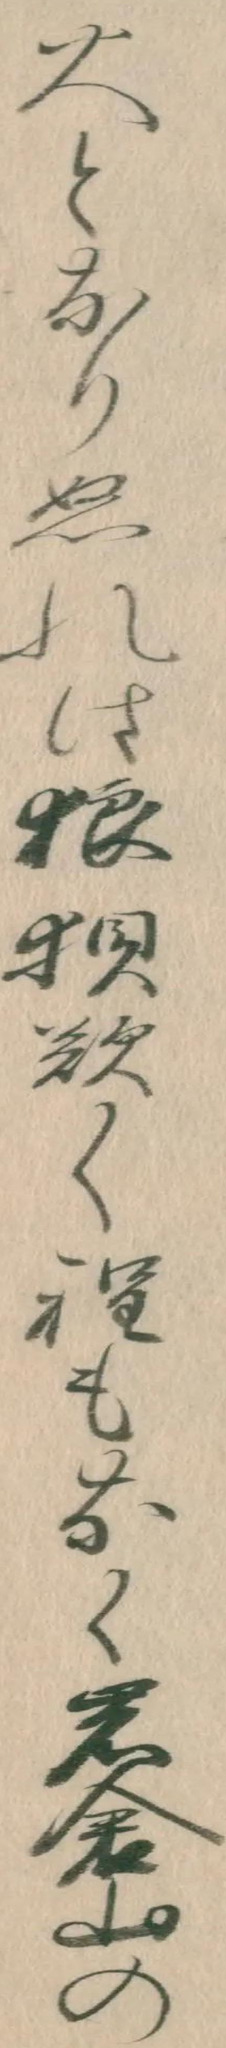火となりぬれは狼狽歎く程もなく岩倉山の
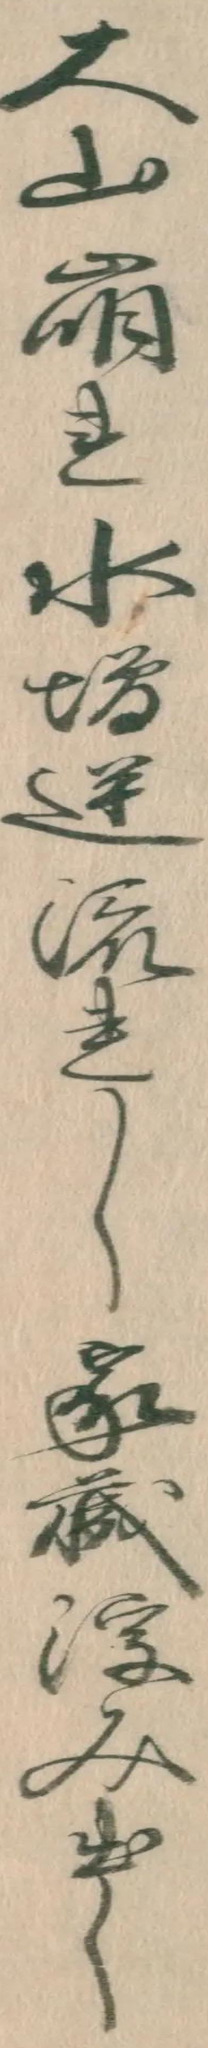大山崩れ水増逆流れし家蔵浮み出し
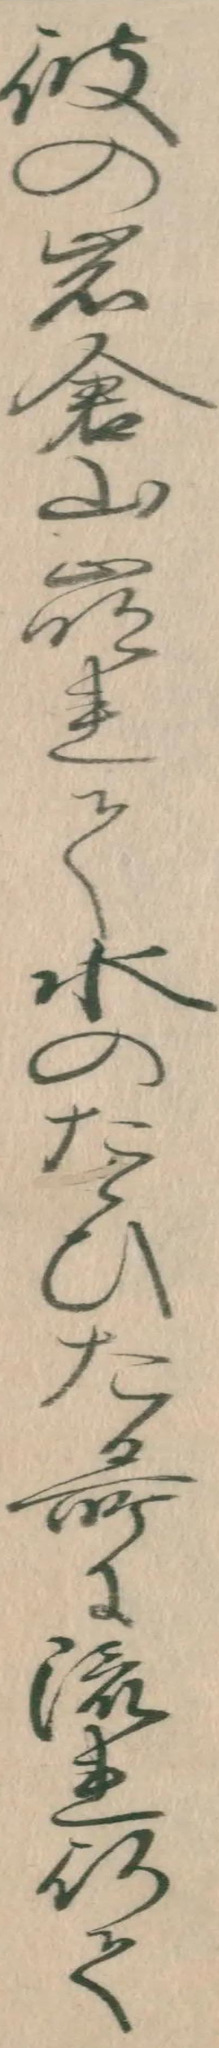彼の岩倉山崩れて水のたゝひたる所に流れ行て
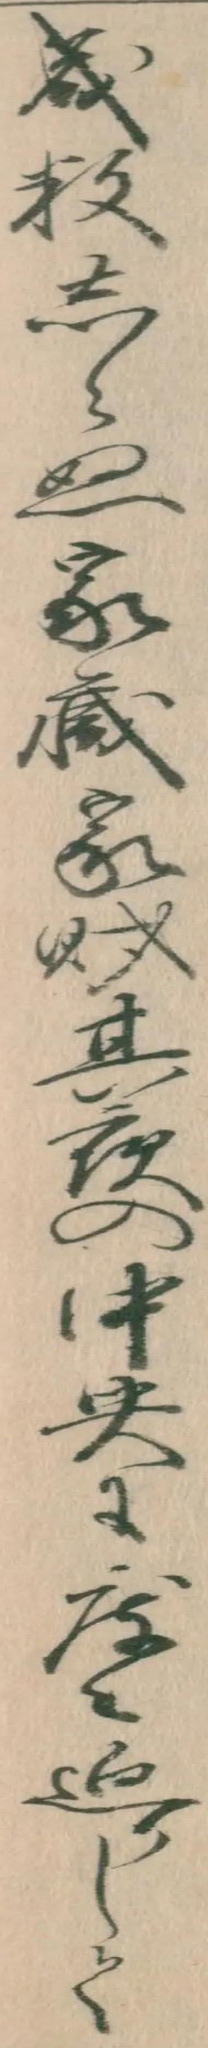幾数しらぬ家蔵家財其夜の中央に度〻迫りして
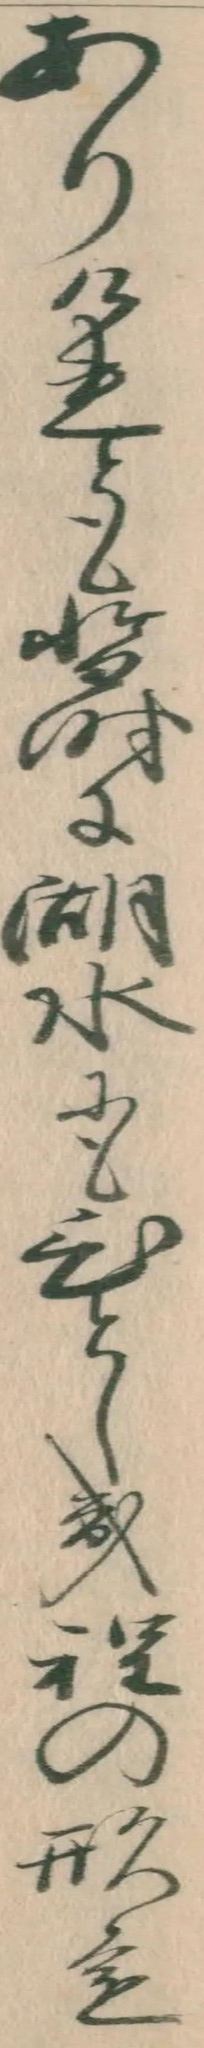ありけれとも暫時に湖水にもひとしき程の形を
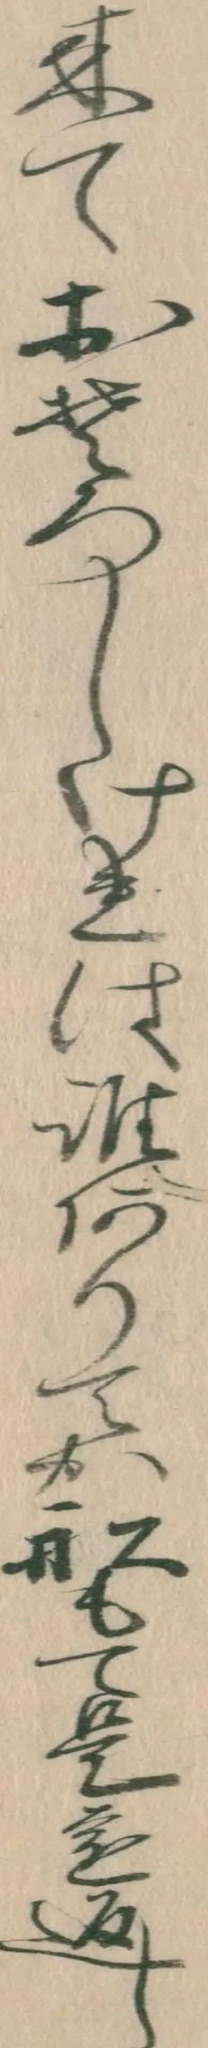来ておそろしけれは誰ありてか船もて是を返し
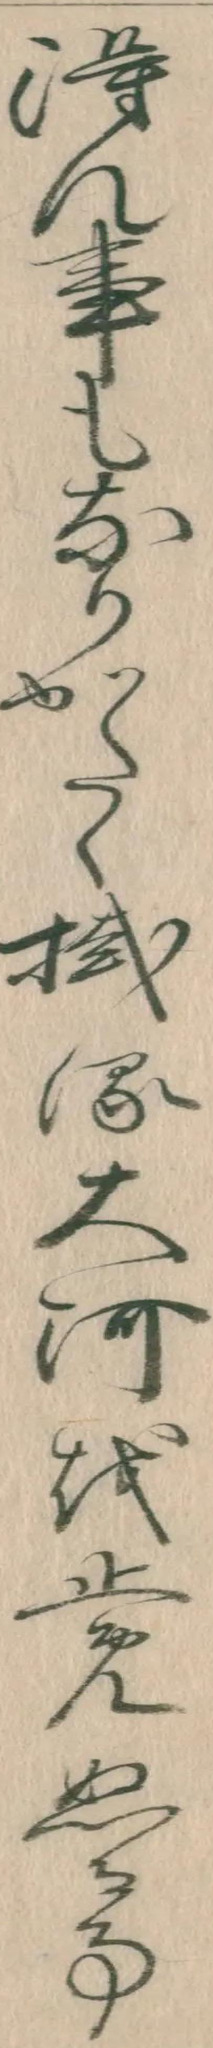得ん事もなりかたく掛る大河を止めぬる事
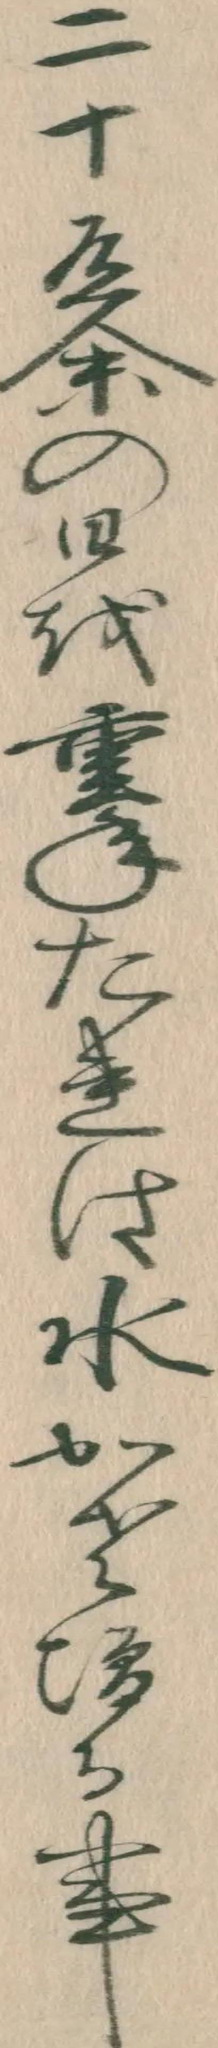二十有余の日を重ねたれは水かさ増る事
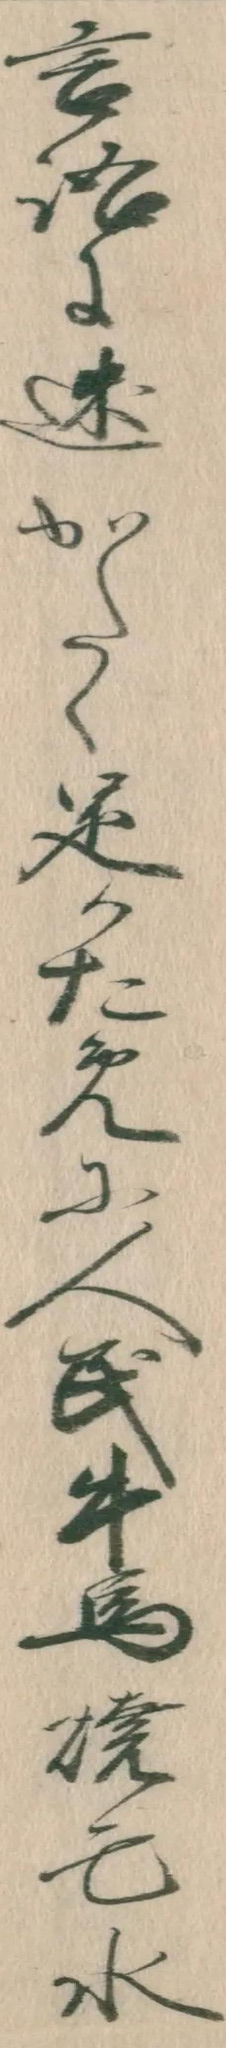言語に述かたく是かために人民牛馬焼亡水
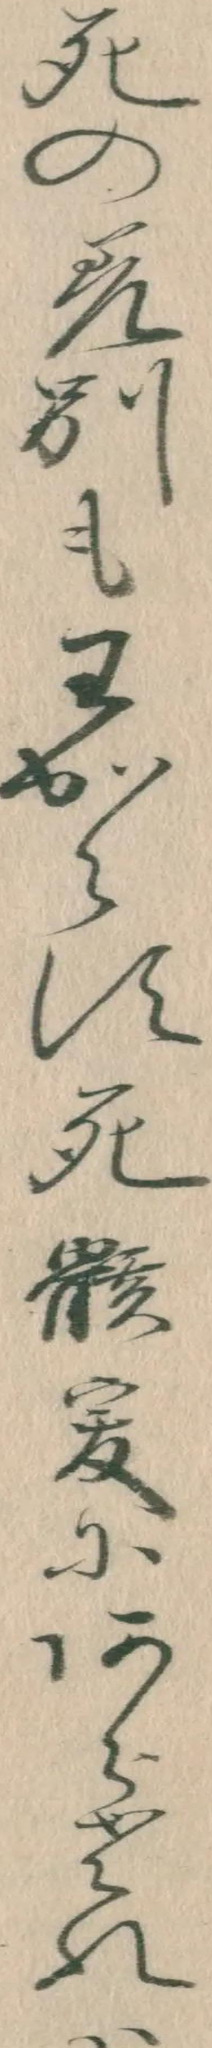死の差別もわからす死骸爰にあらされは
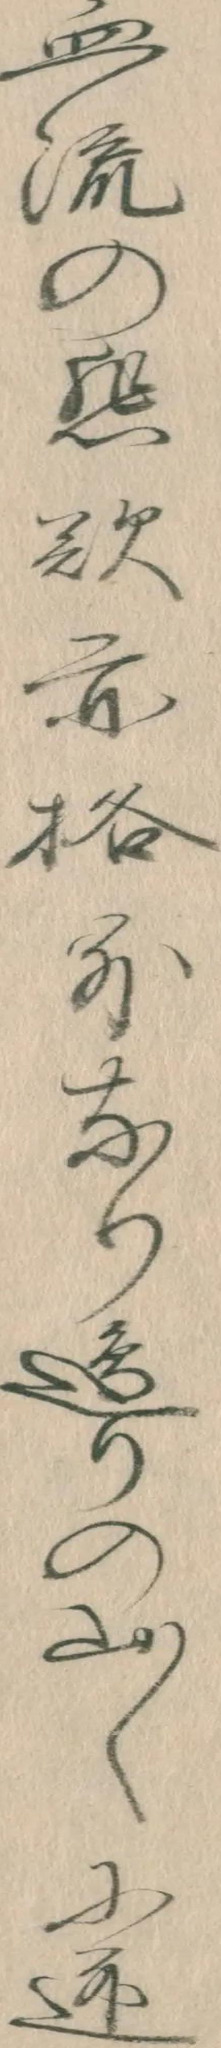血流の悲歎亦格外なり辺りの山〳〵に逃
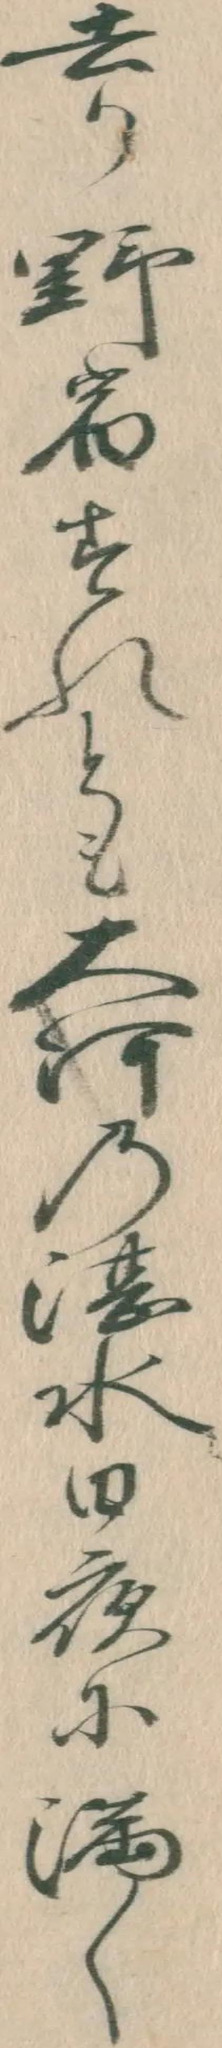去り野宿すれとも大河の湛水日夜に満〳〵
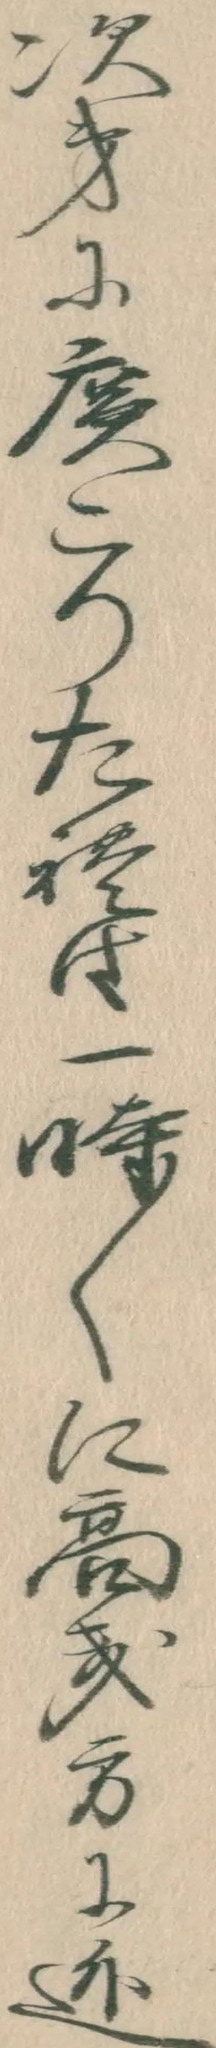次第に広こりたれは一時〳〵に高き方に逃
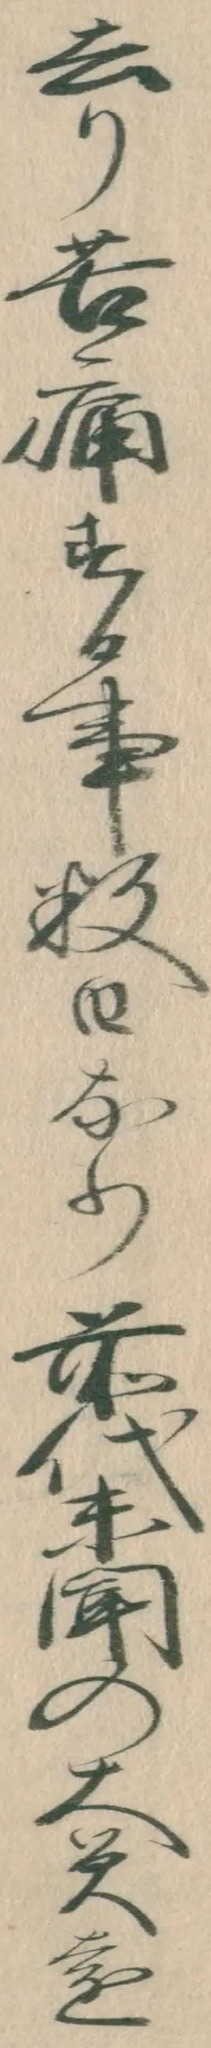去り苦痛する事数日なり前代未聞の大災を

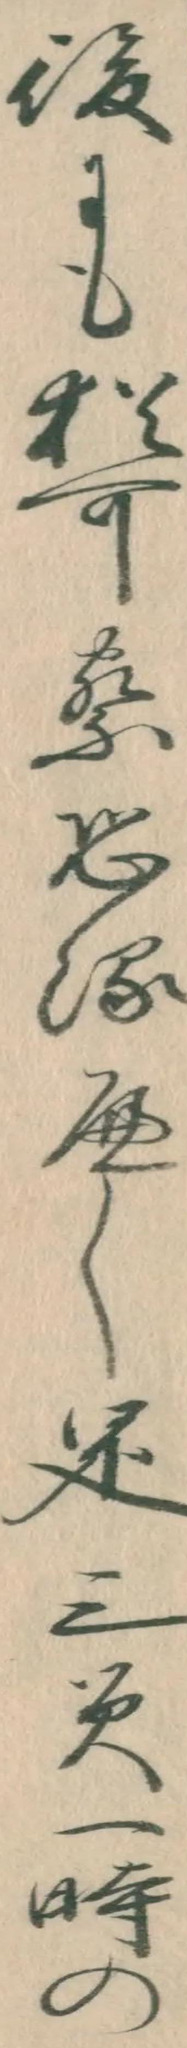後にも猶可察恐るへし是三災一時の
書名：俗語之種. [6]
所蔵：国立国会図書館 National Diet Library, JAPAN
